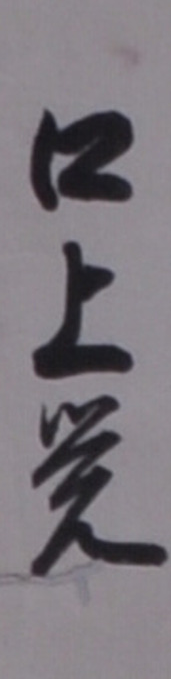口上覚
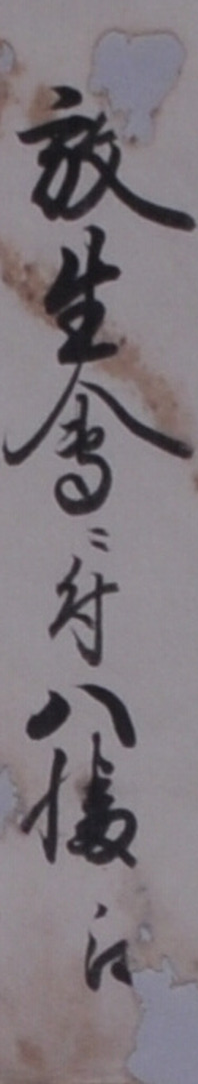放生会に付八幡え
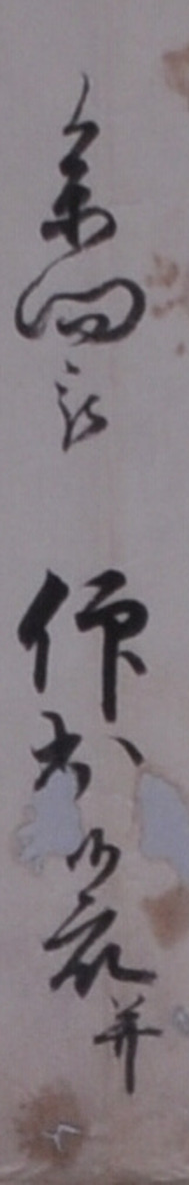参向被仰出候衆并
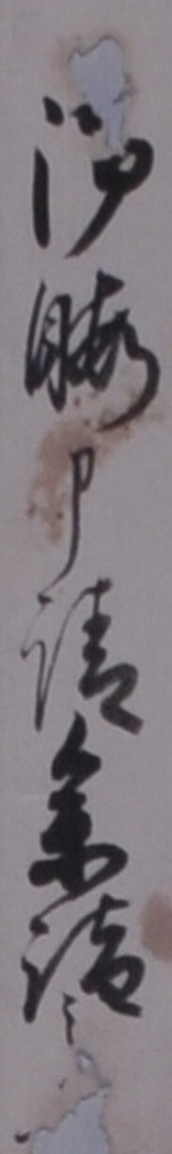御暇申請参詣之
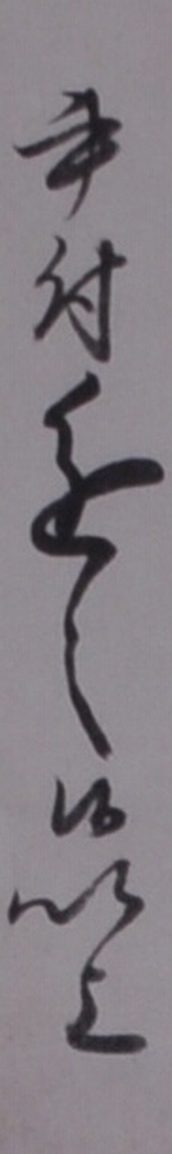書付進之候以上
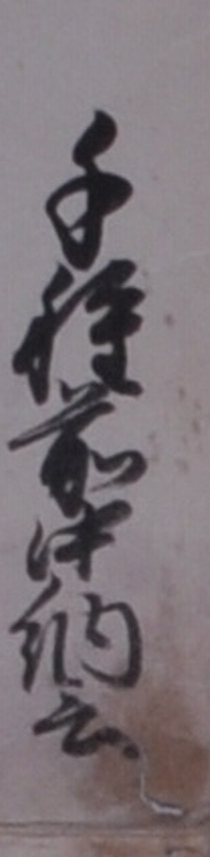千種前中納言
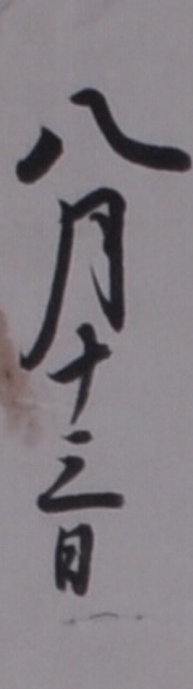八月十三日
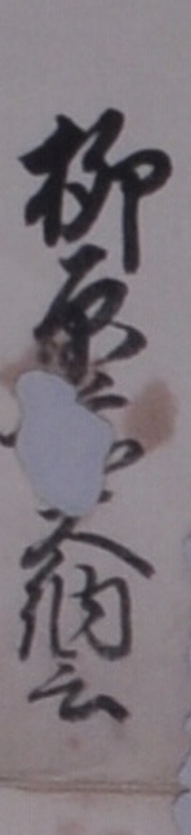柳原大納言
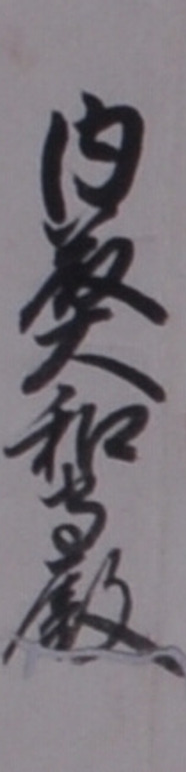内藤大和守殿
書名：口上覚
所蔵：伊那市立高遠町図書館・合同会社AMANE
